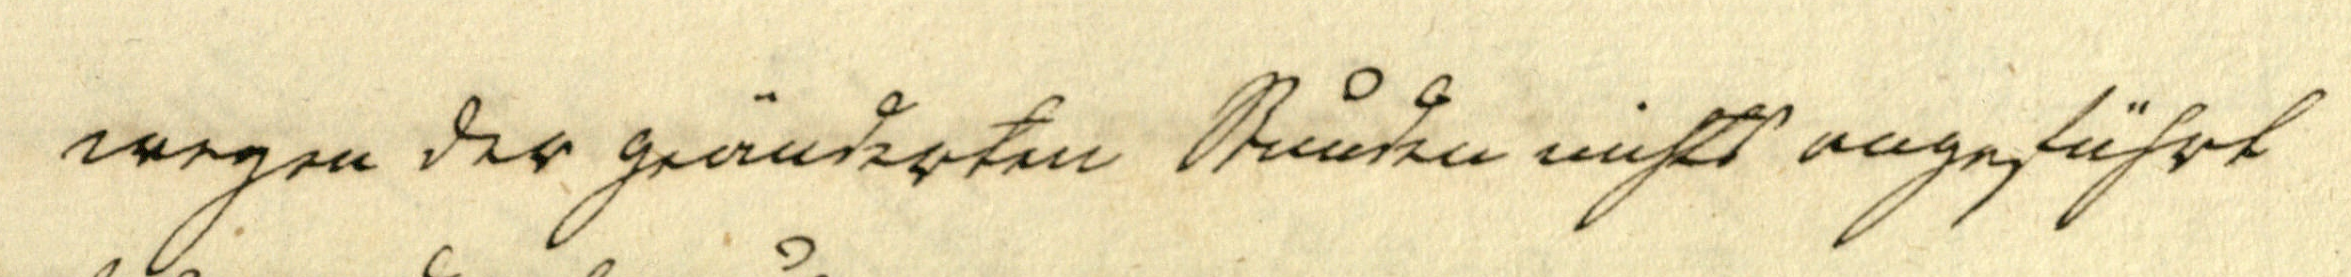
wegen der geänderten Stunden nichts angeführt
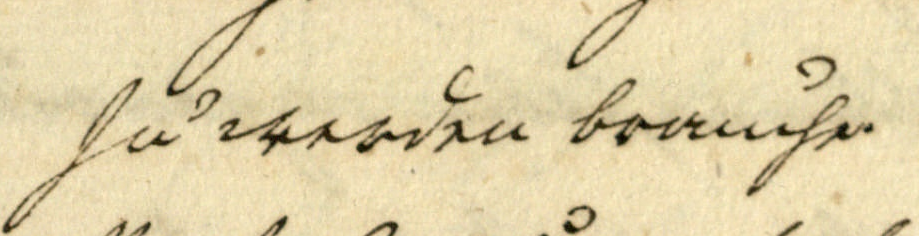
zu werden brauche.
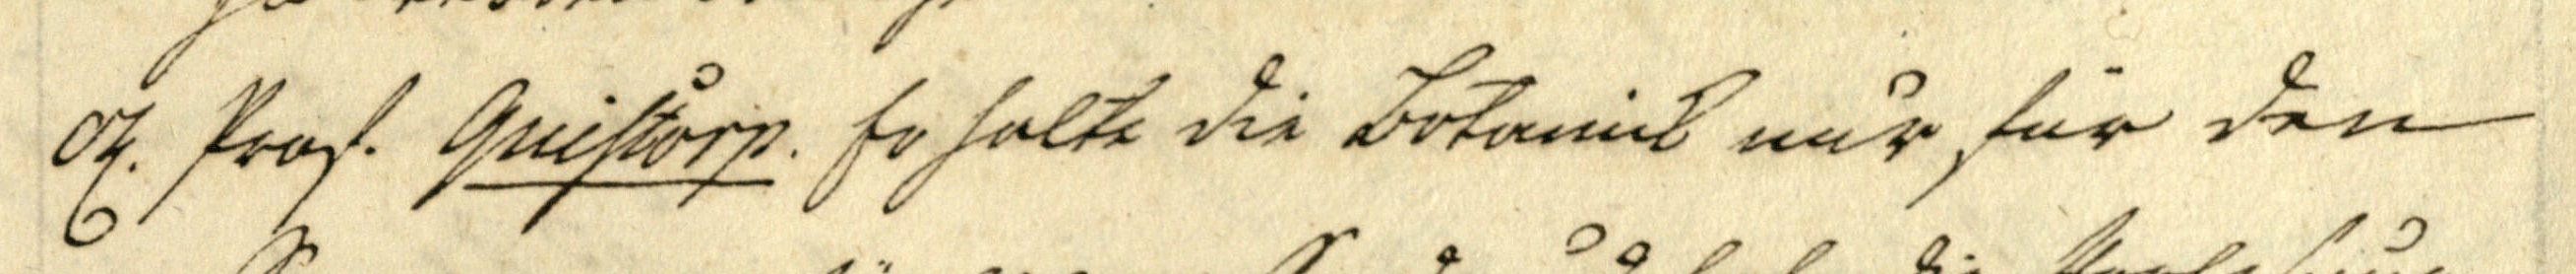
dh. Prof. Quistorp. Er halte die Botanick nur für den
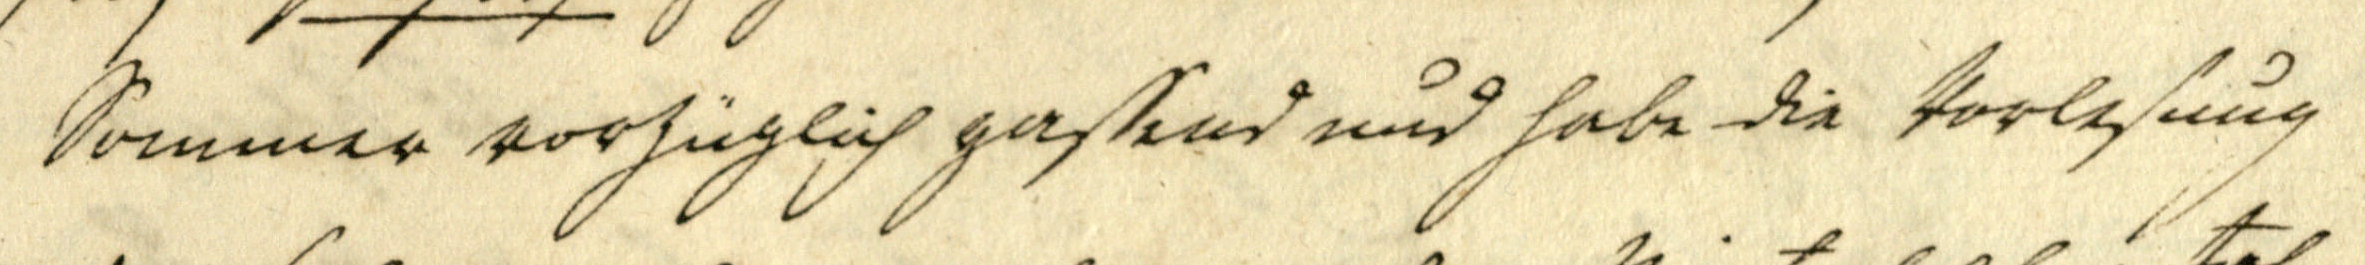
Sommer vorzüglich passend und habe die Vorlesung
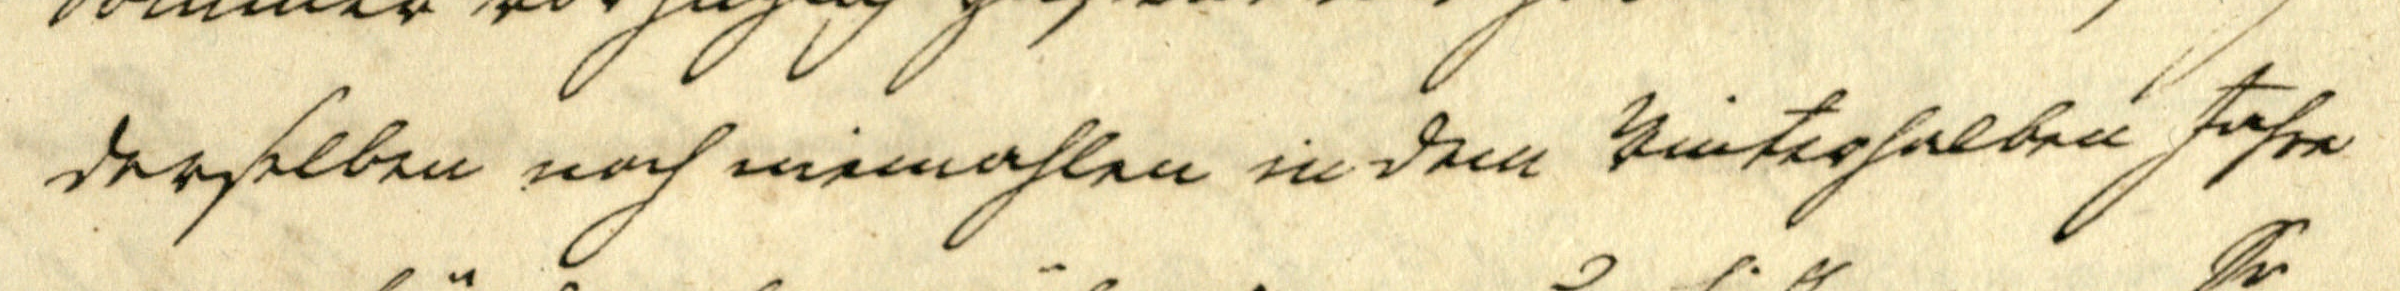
derselben noch niemahlen in dem Winterhalben Jahre
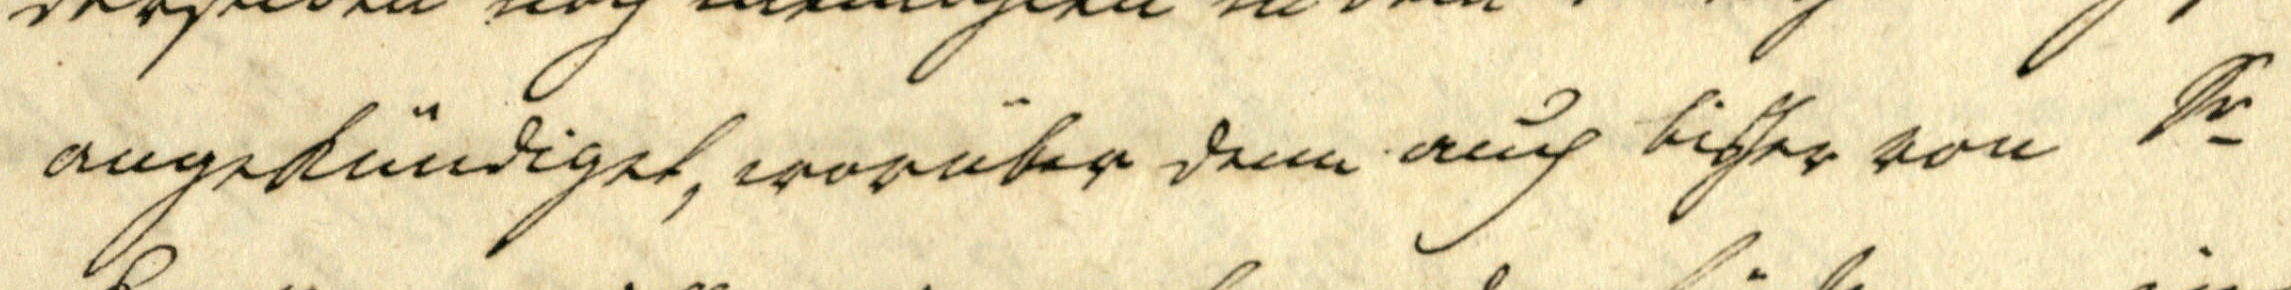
angekündiget, worüber denn auch bisher von Sr
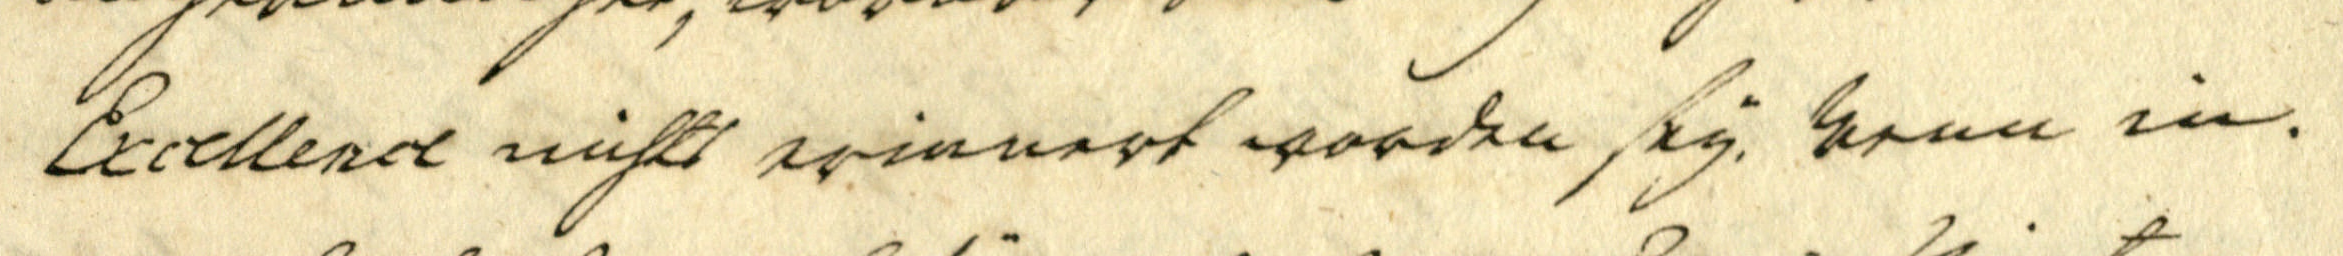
Excellence nichts erinnert worden seÿ. Wenn in¬
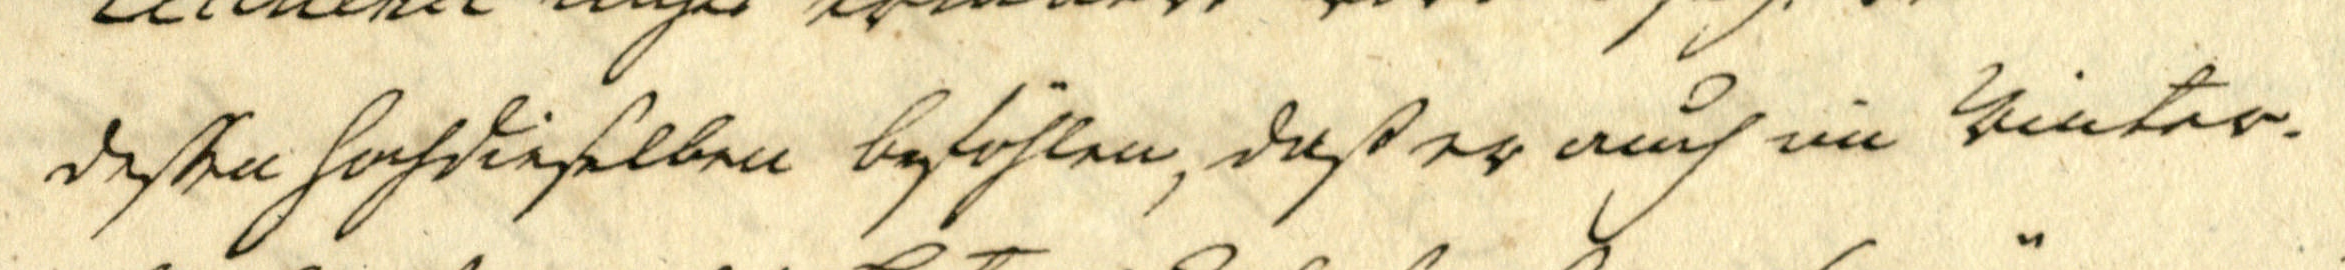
dessen hochdieselben beföhlen, daß er auch im Winter¬
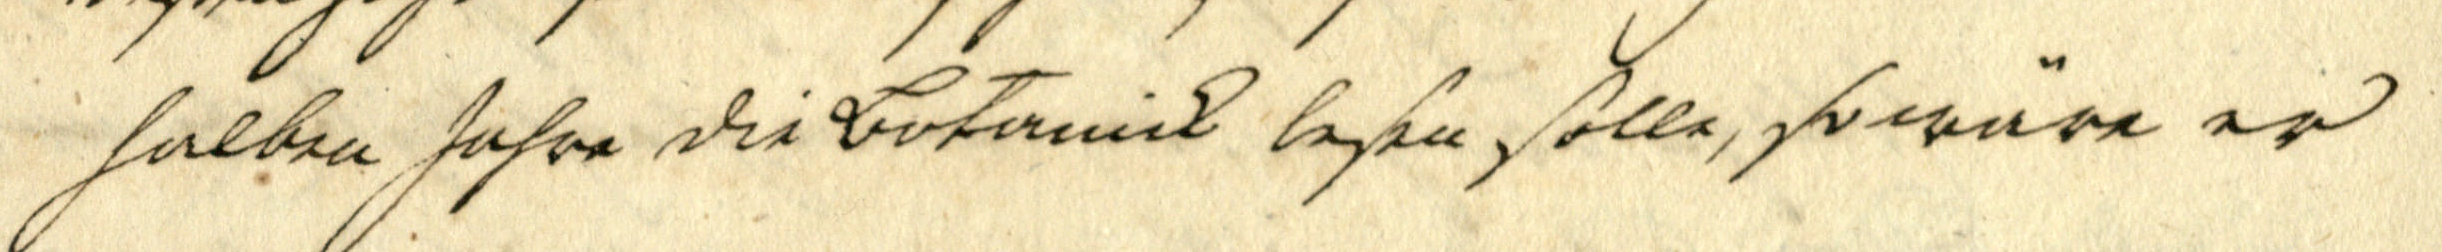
halben Jahre die Botanick lesen solle, so wäre er
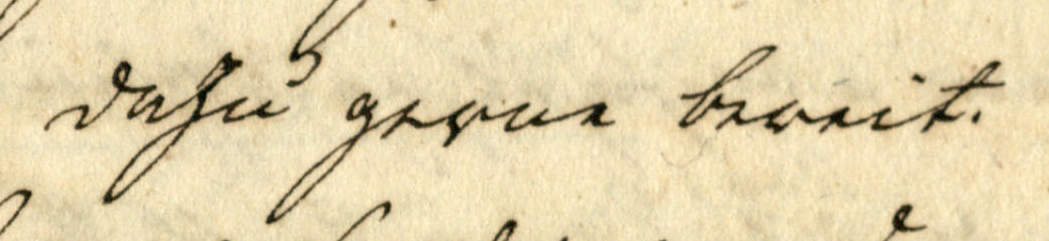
dahin gerne bereit.
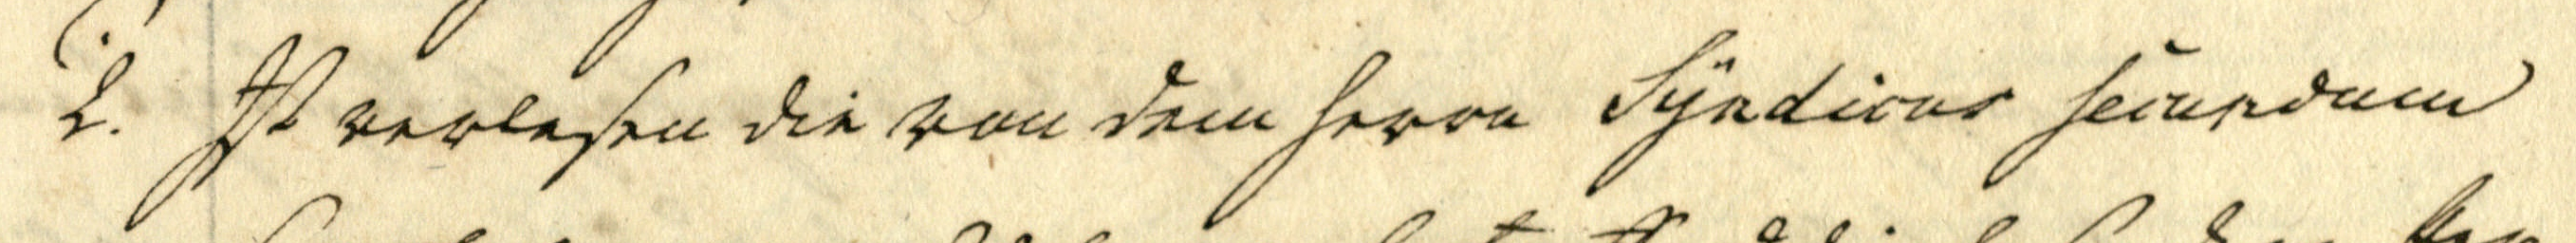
2. Ist verlesen die von dem Herrn Sÿndicus secundum
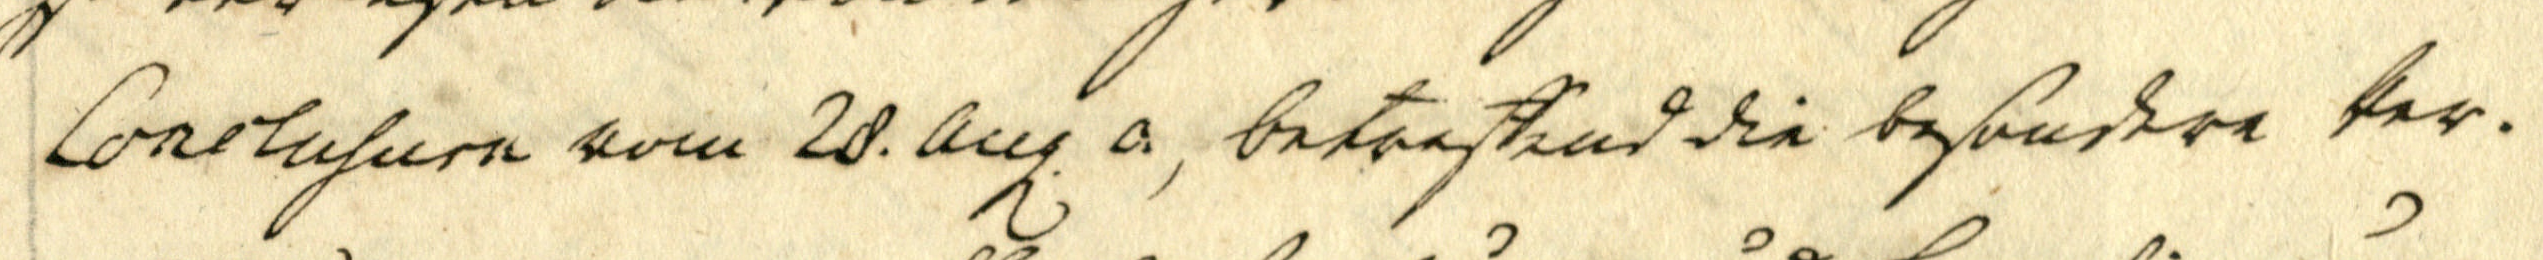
Conclusum vom 28. Aug. a, betreffend die besondere Ver¬
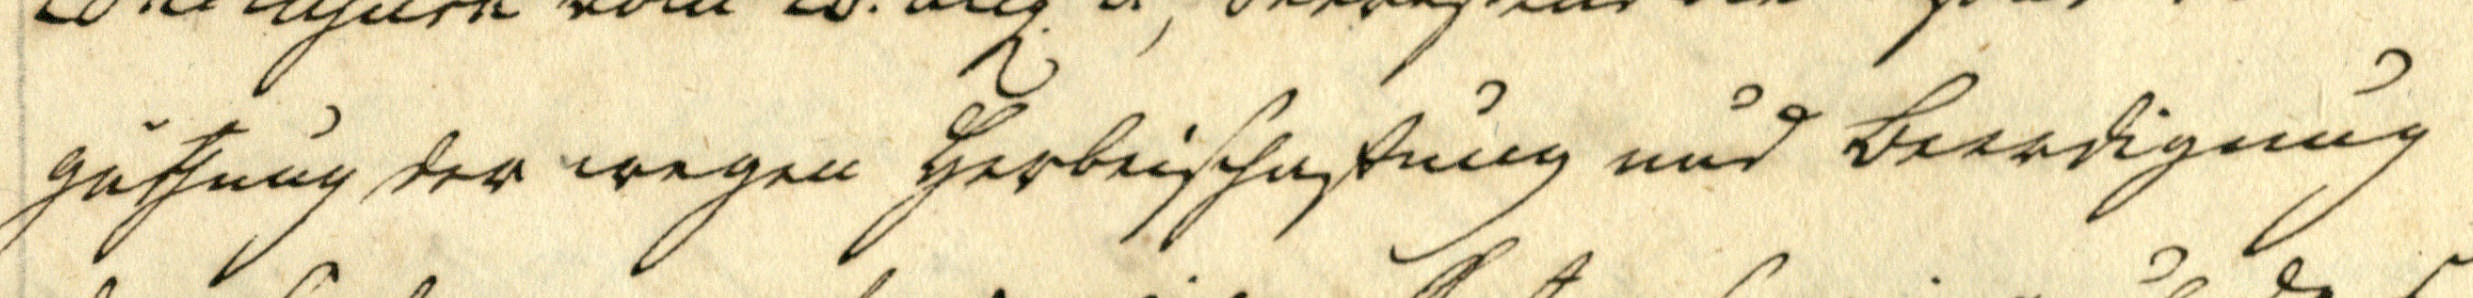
güthung der wegen Herbeischafung und Beerdigung
